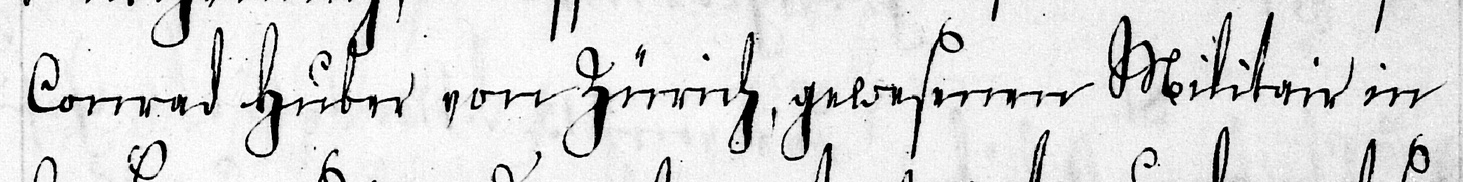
Conrad Huber von Zürich, gewesenen Militair in
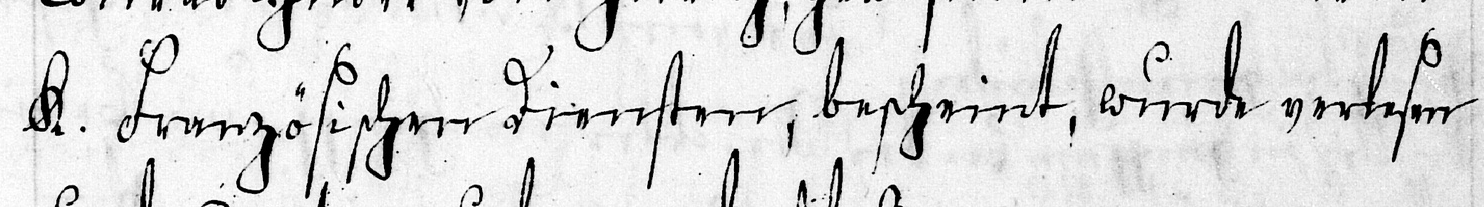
K. Französischen Diensten, bescheint, wurde verlesen
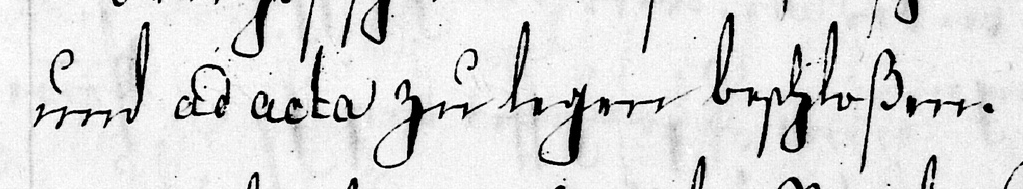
und ad acta zu legen beschloßen.
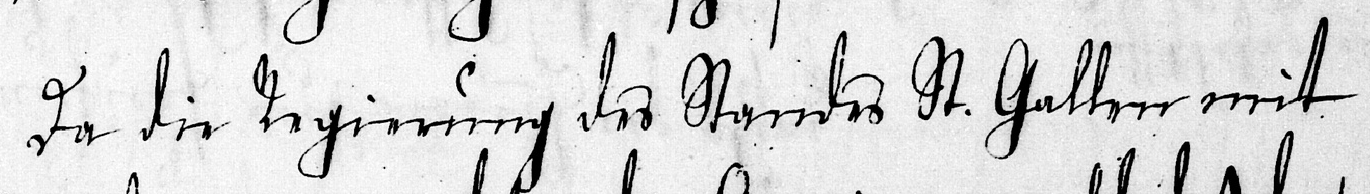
Da die Regierung des Standes St. Gallen mit
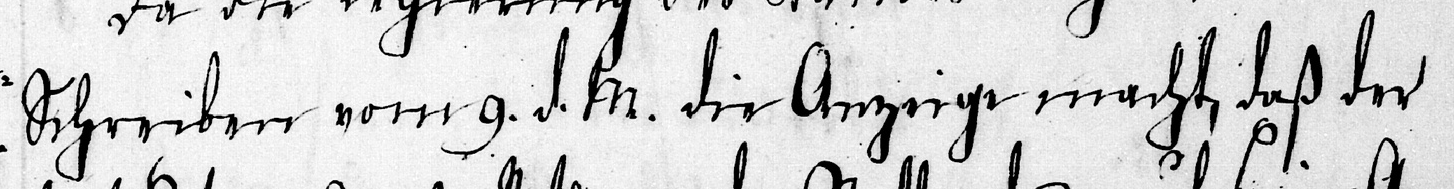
Schreiben vom 9. d. M. die Anzeige macht, daß der
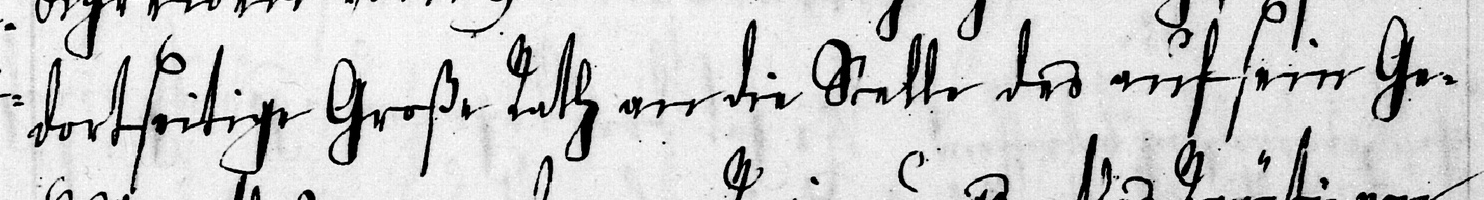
dortseitige Große Rath an die Stelle des auf sein Ge¬
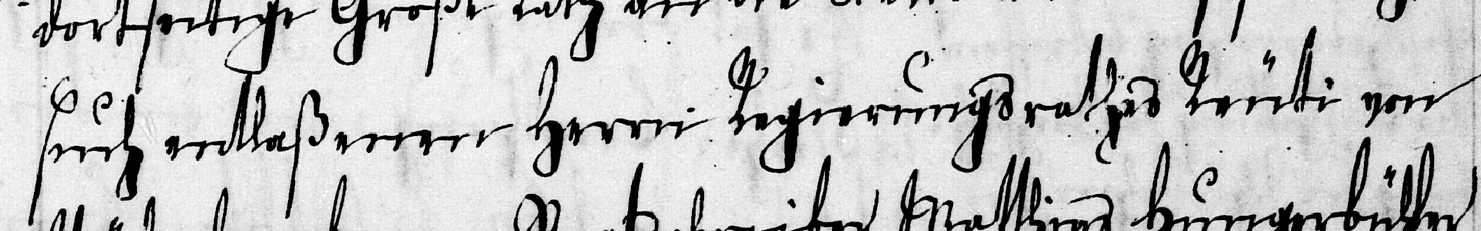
such entlaßenen Herrn Regierungsrathes Reuti von
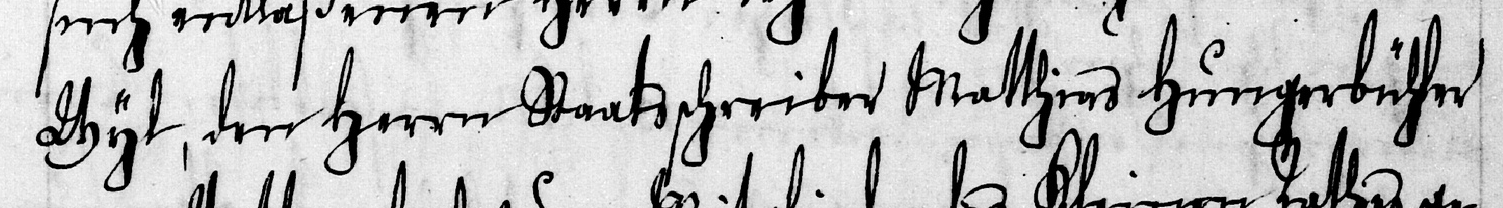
Wyl, den Herrn Staatsschreiber Matthias Hungerbühler
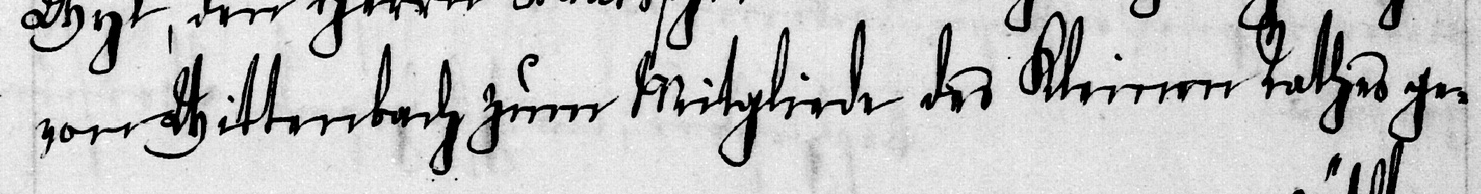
von Wittenbach zum Mitgliede des Kleinen Rathes ge-
